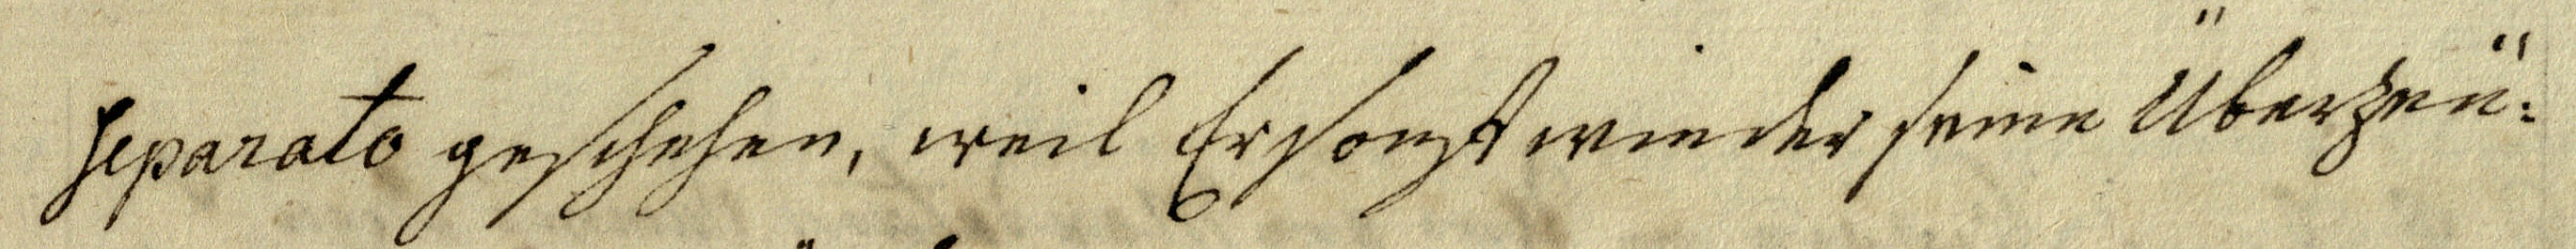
separato geschehen, weil Er sonst wieder seine Überzeu¬
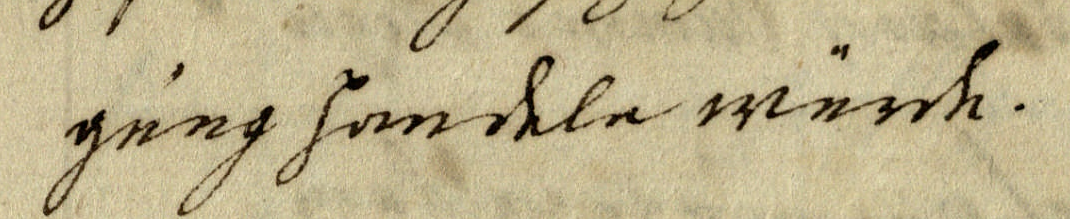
gung handeln würde.
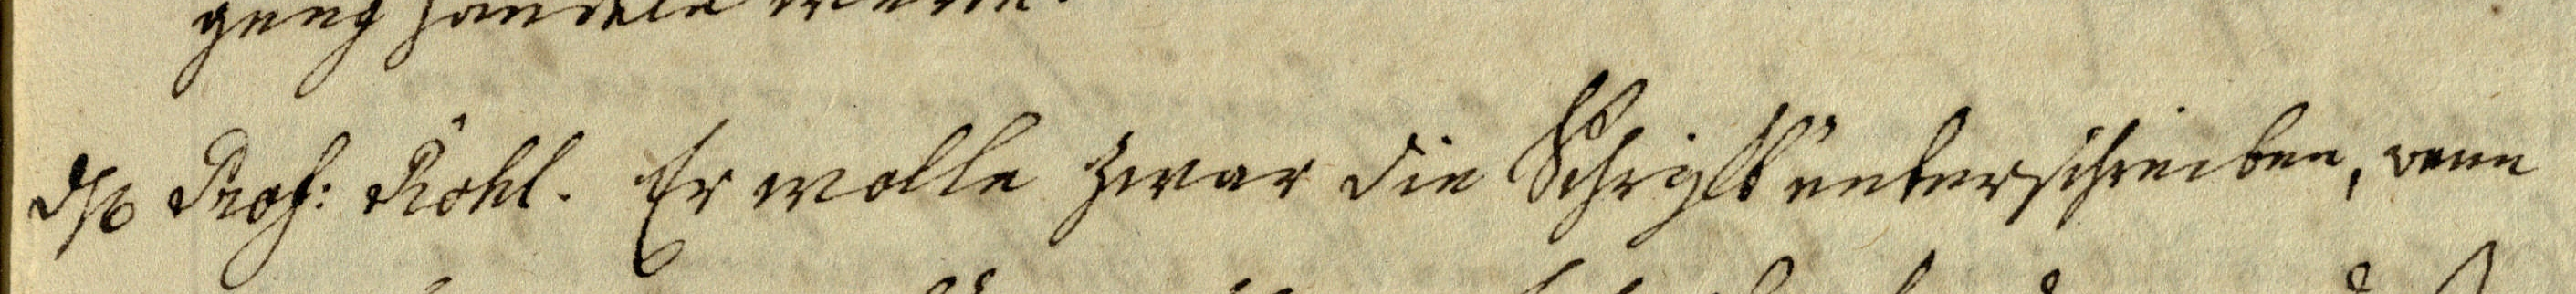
dh Prof. Röhl. Er wolle zwar die Schrift unterschreiben, wenn
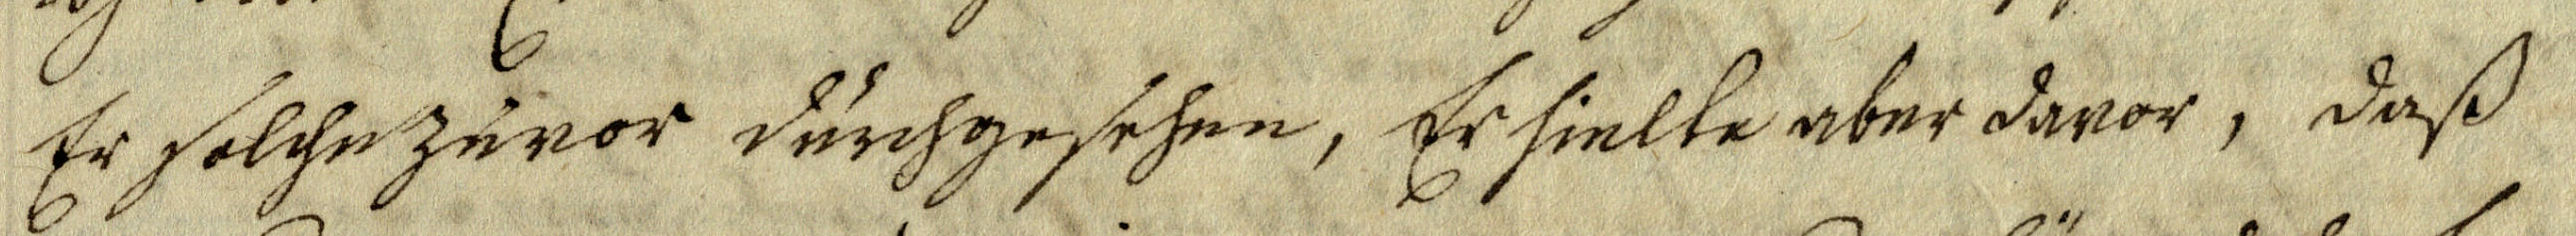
Er solche zuvor durchgesehen, Er hielte aber davor, daß
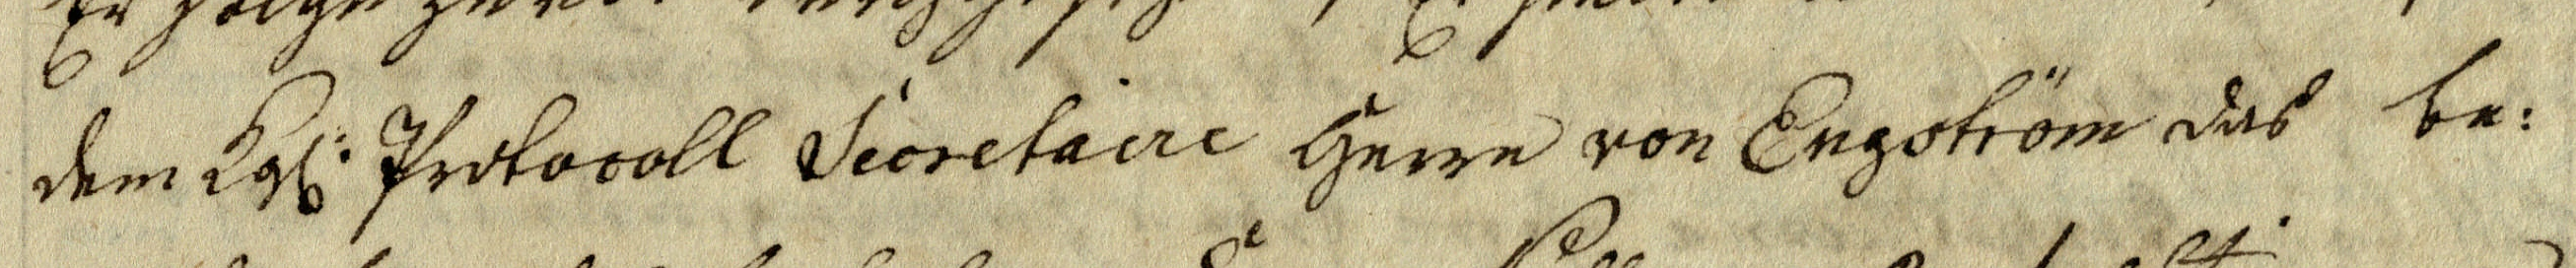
dem Kgl. Protocoll Secretaire Herrn von Engström das be¬
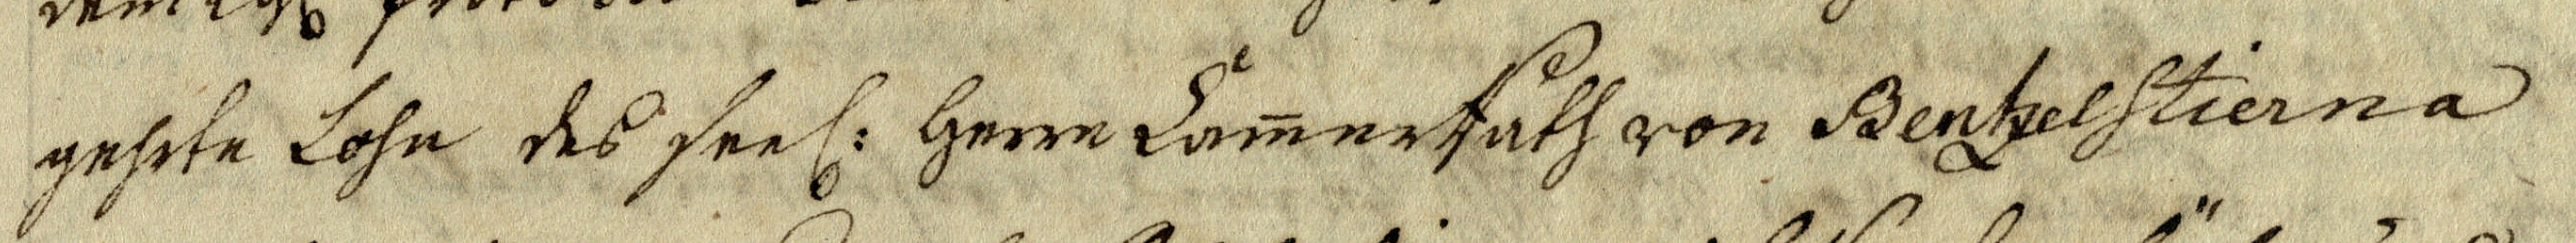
gehrte Lohn des seel. Herrn CamerRath von Bentzelstierna
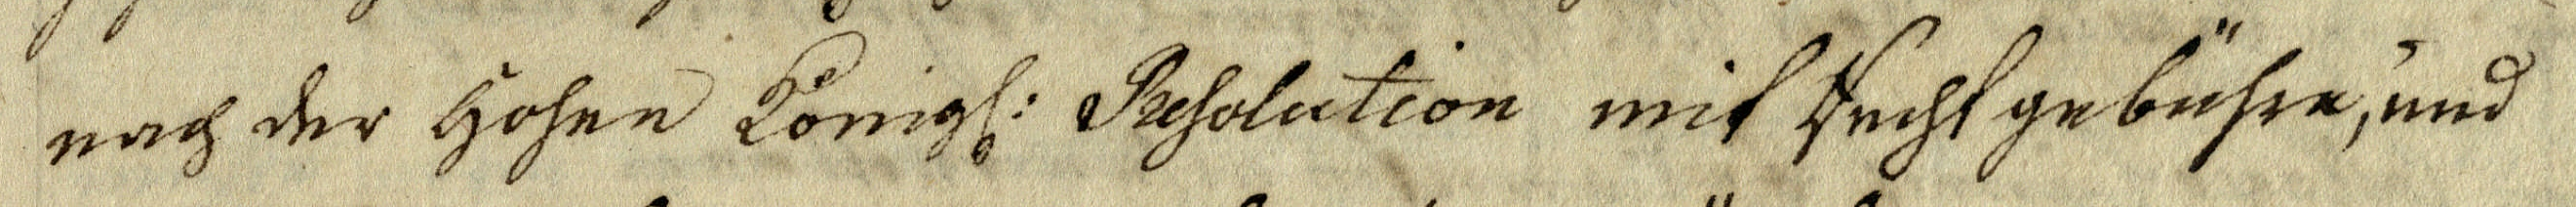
nach der Hohen Königl. Resolution mit Recht gebühre, und
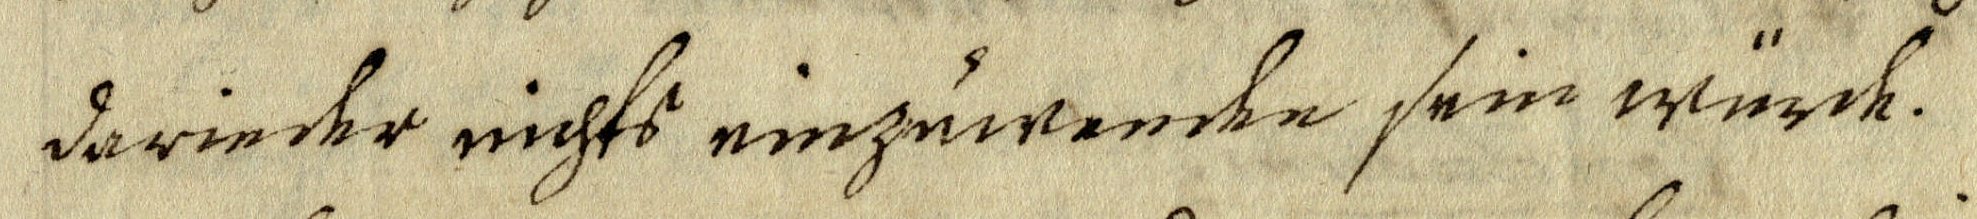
dawieder nichts einzuwenden sein würde.
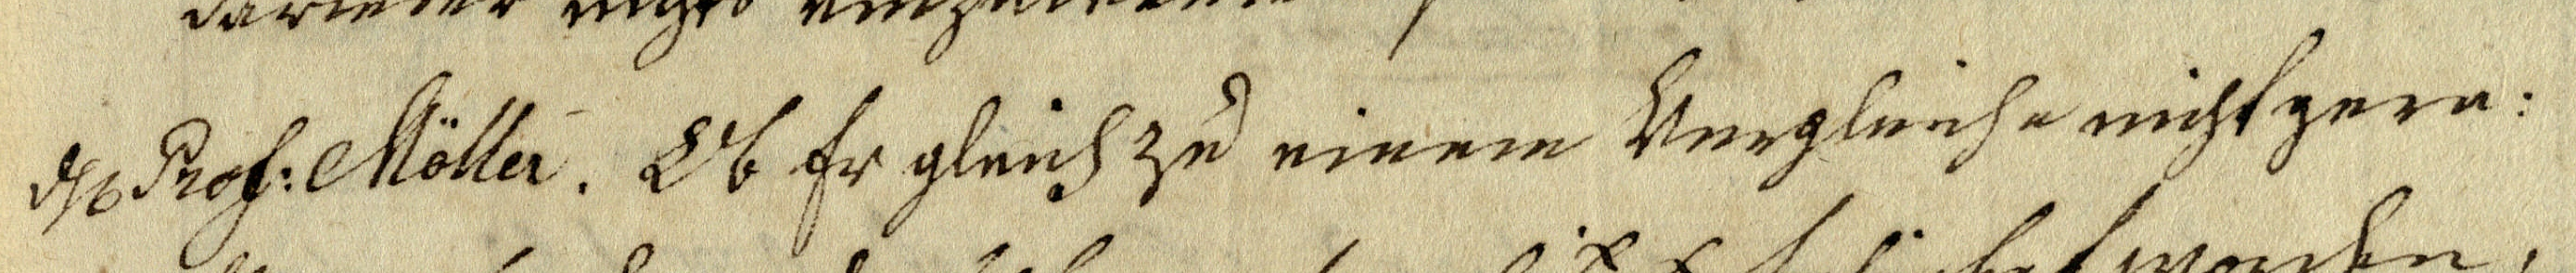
dh Prof. Möller. Ob Er gleich zu einem Vergleiche nicht gera¬
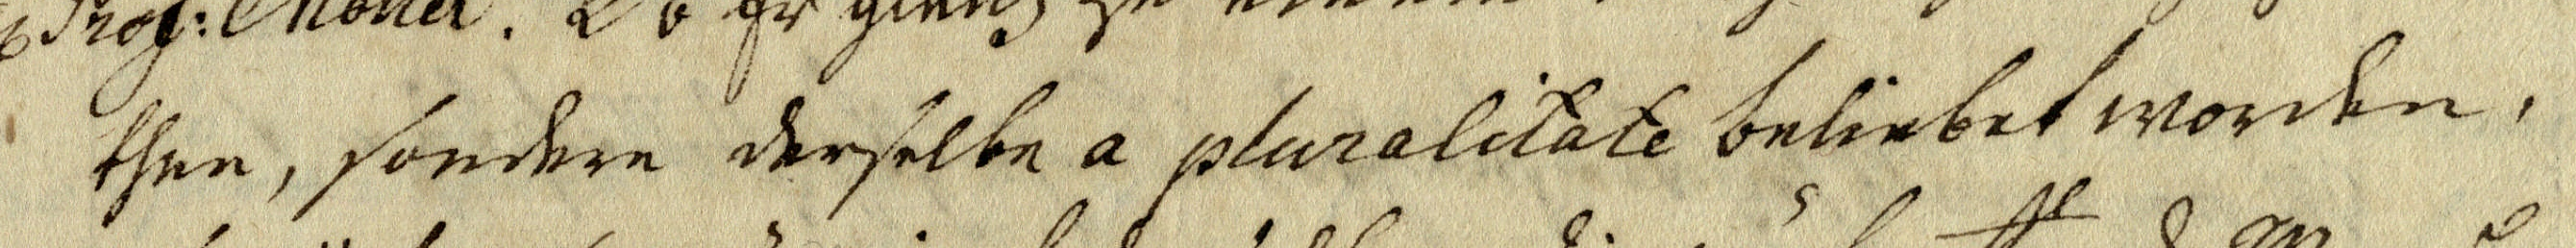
then, sondern derselbe a pluralitate beliebet worden,
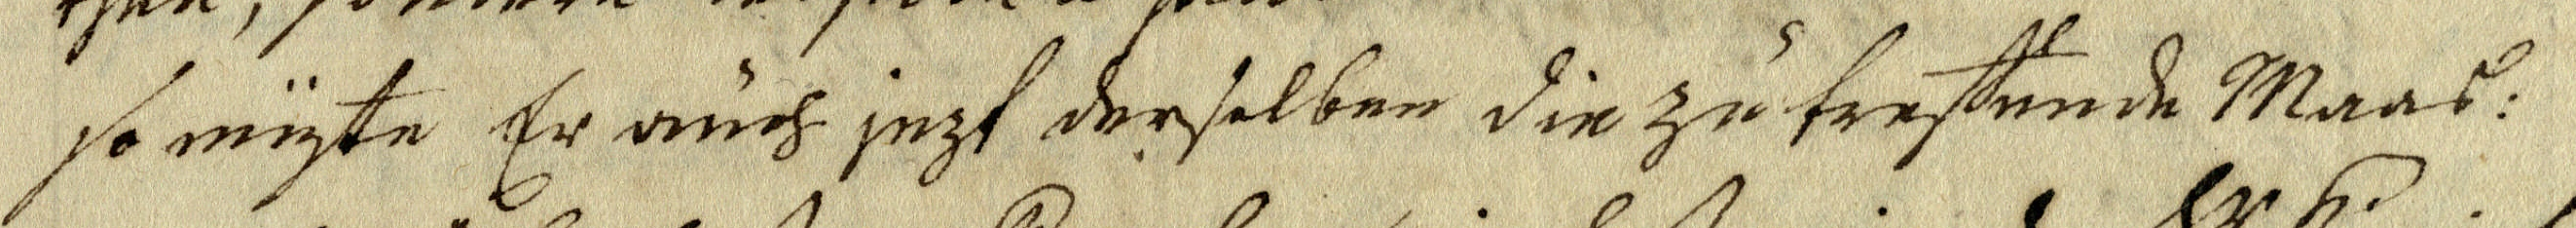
so müste Er auch jezt derselben die zu treffende Maas¬
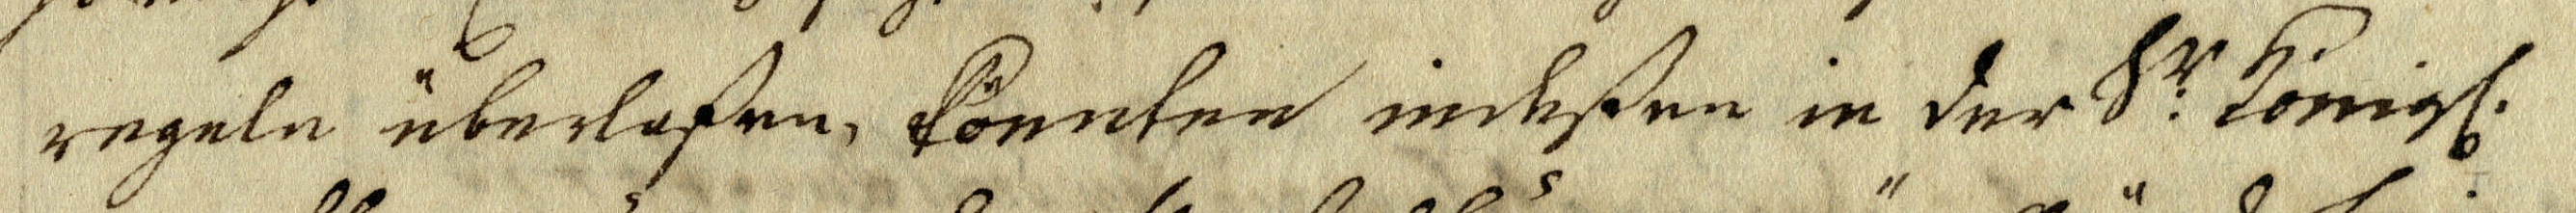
regeln überlaßen. Könnten indeßen in der Sr. Königl.
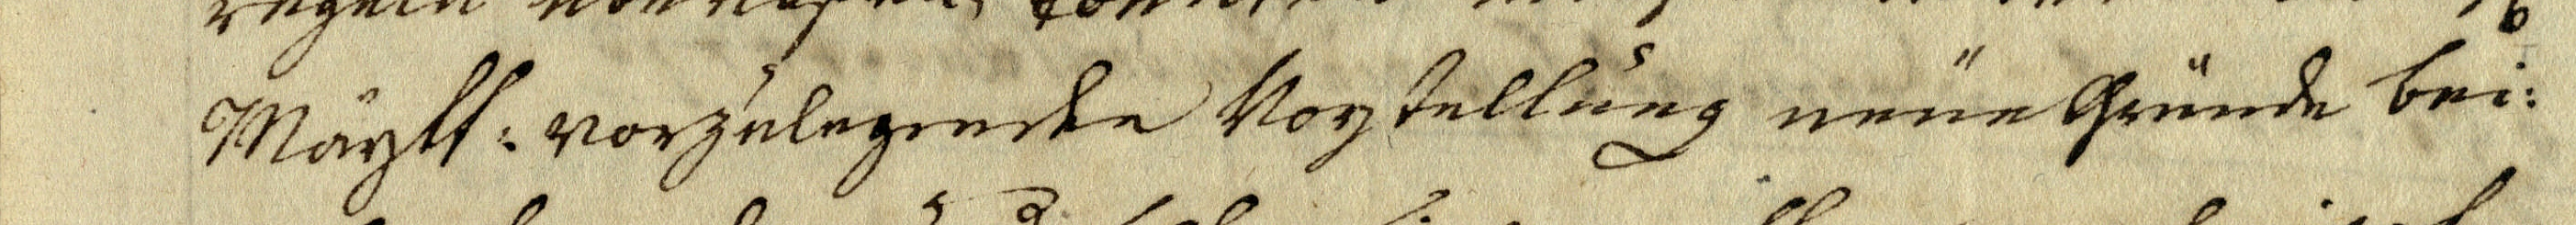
Maÿtt. vorzulegenden Vorstellung neue Gründe bei¬
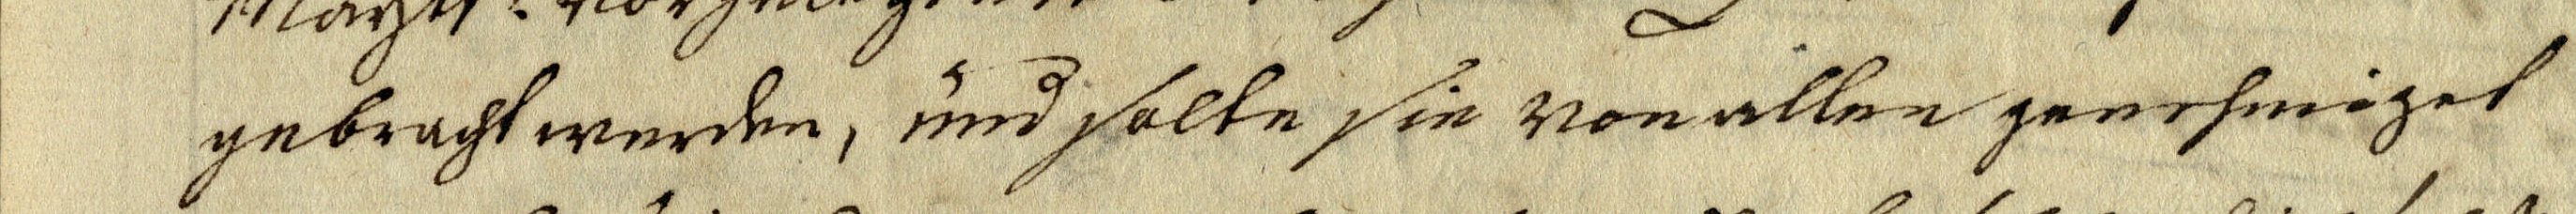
gebracht werden, und solte sie von allen genehmiget
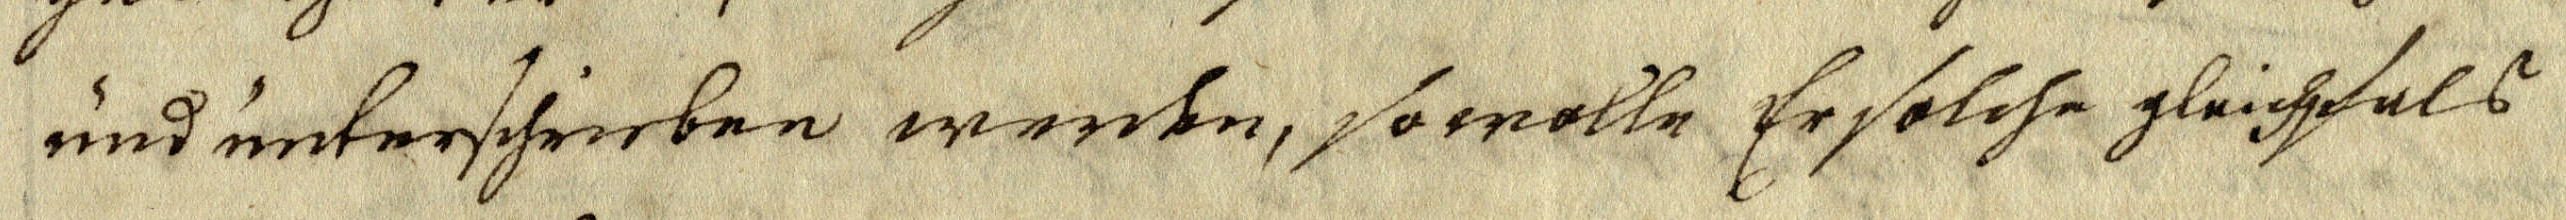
und unterschrieben werden, so wolle Er solche gleichfals
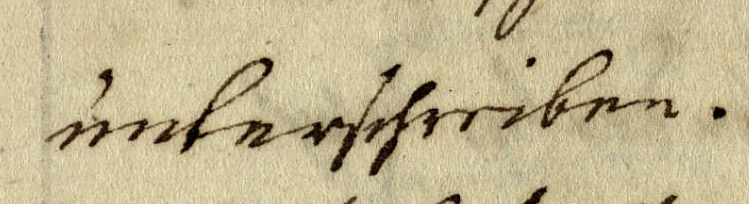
unterschreiben.
